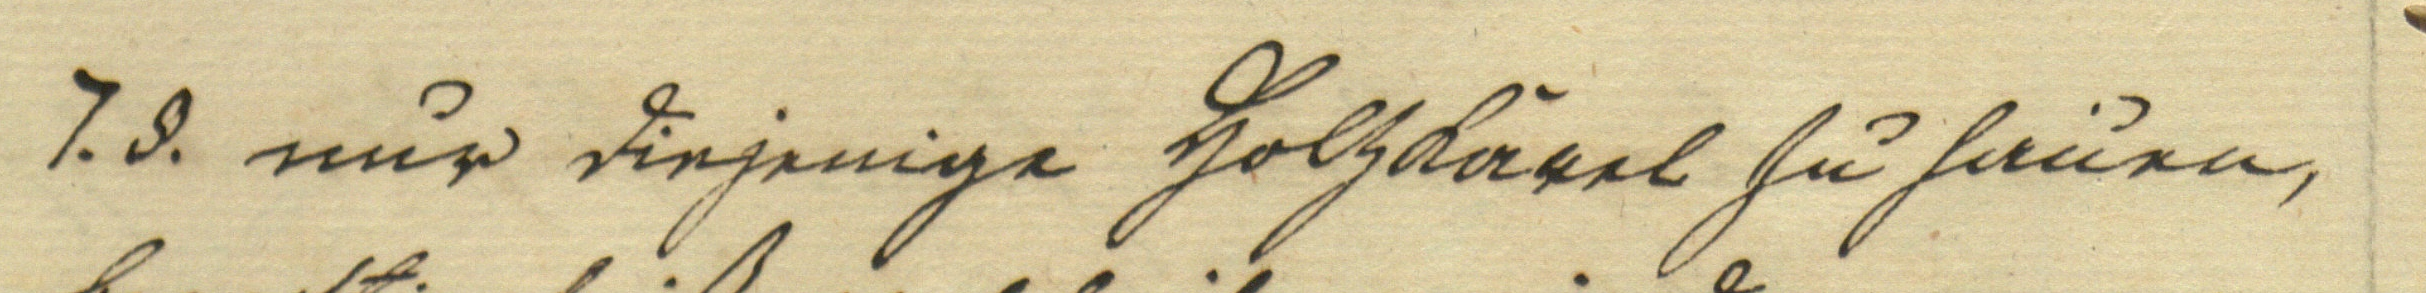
7. §. nur diejenige Holzkavel zu hauen,
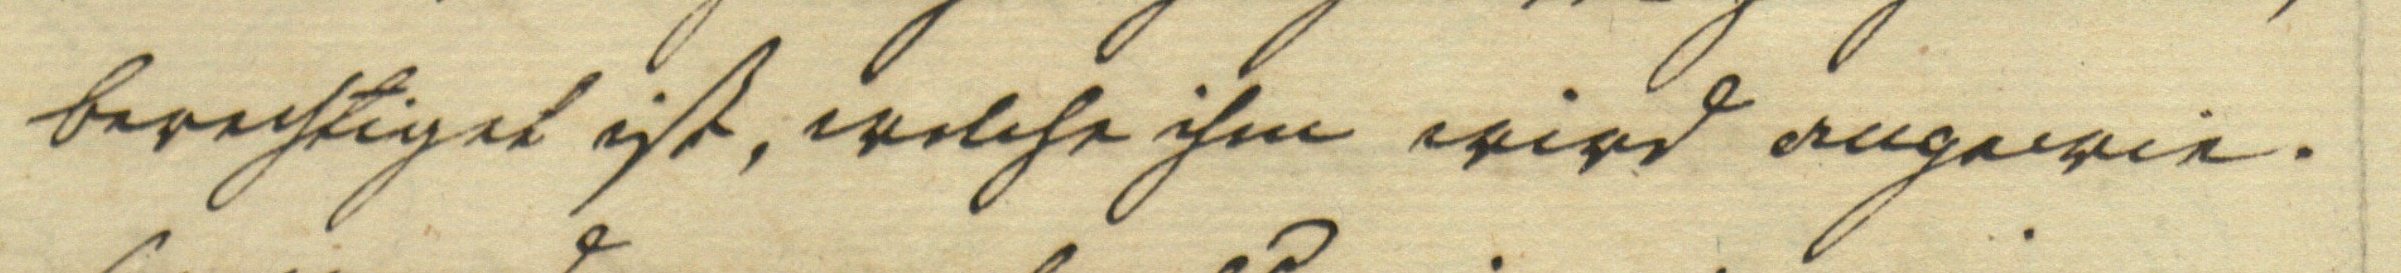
berechtiget ist, welche ihm wird angewie¬
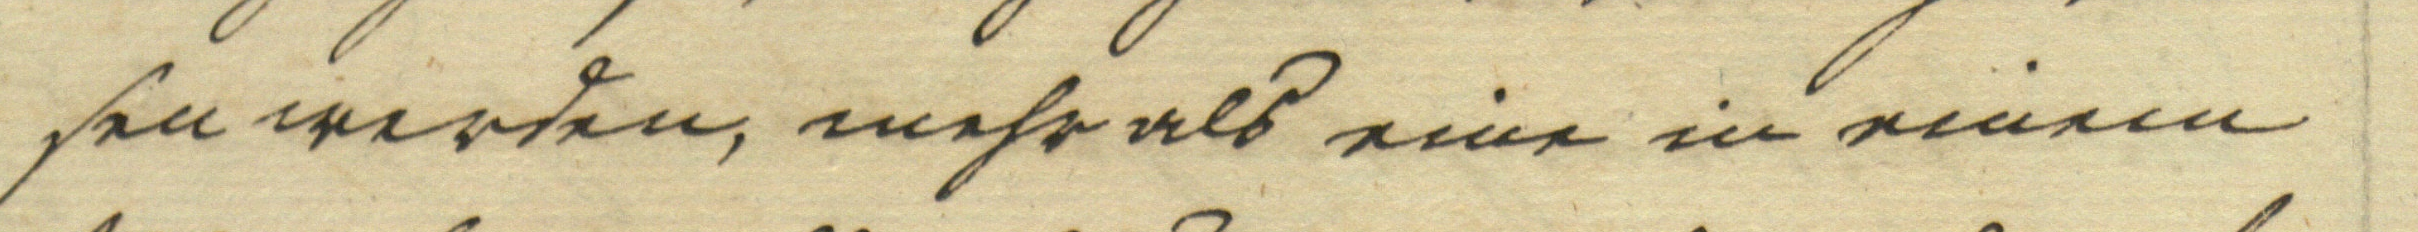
sen werden, mehr als eine in einem
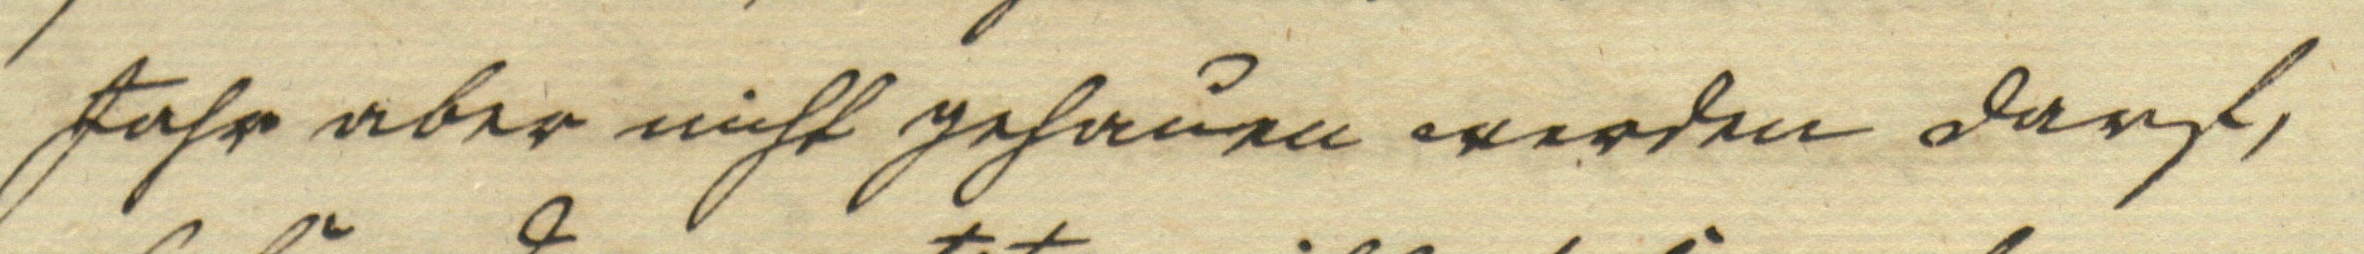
Jahr aber nicht gehauen werden darf,
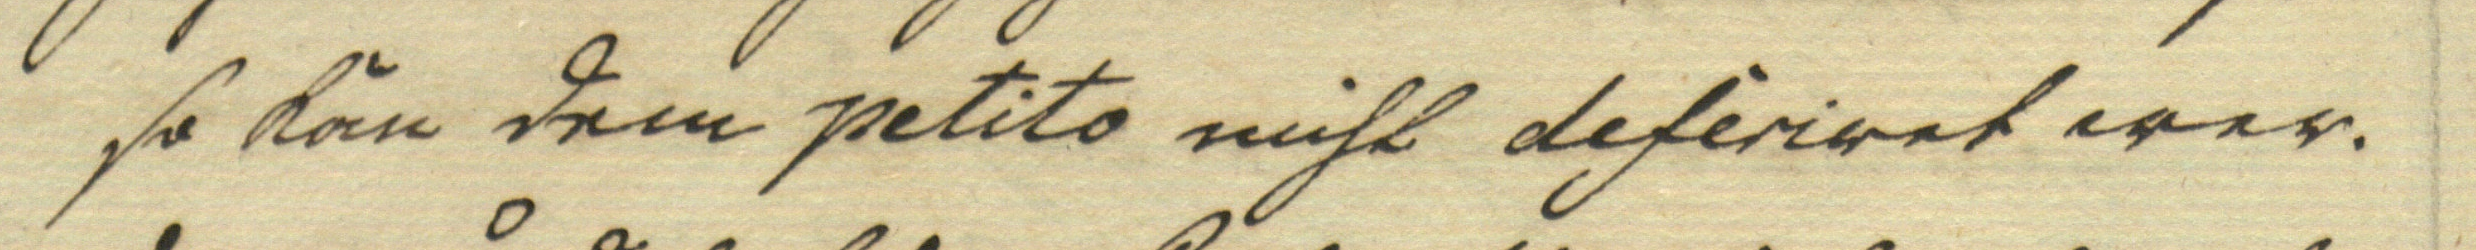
so kan dem petito nicht deferiret wer¬
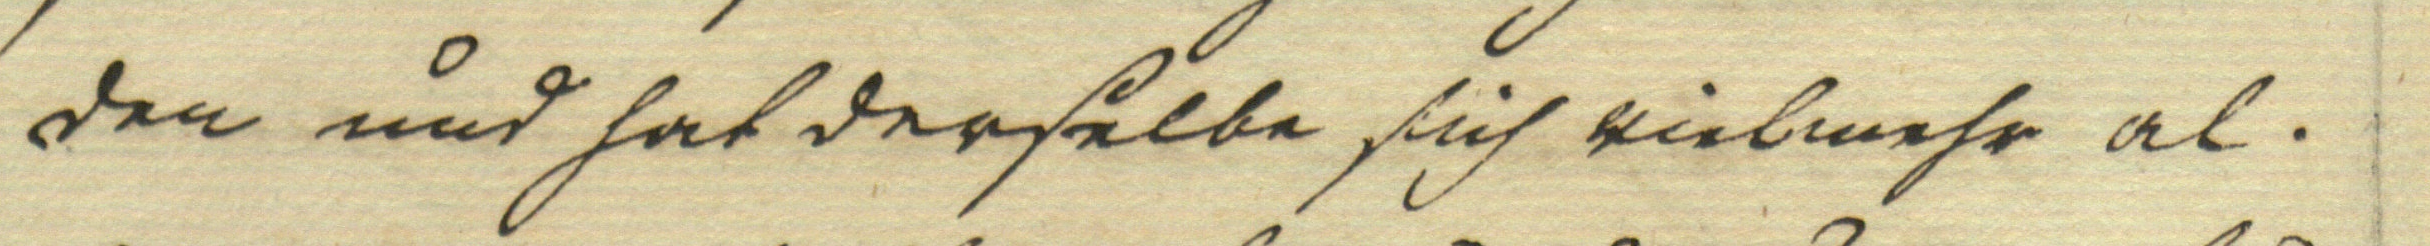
den und hat derselbe sich vielmehr al¬
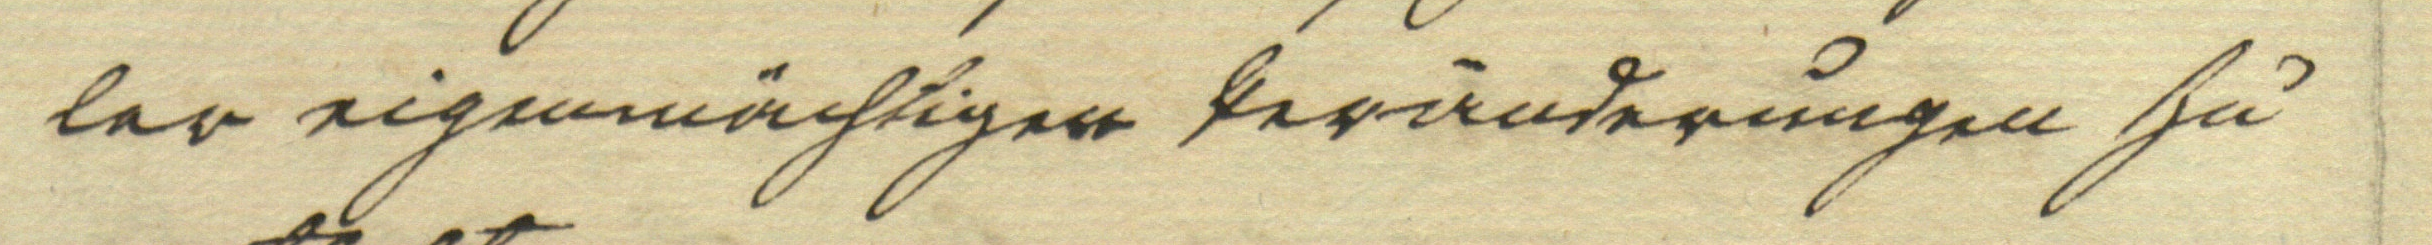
ler eigenmächtigen Veränderungen zu
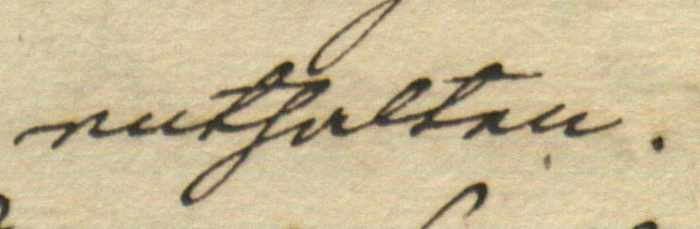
enthalten.
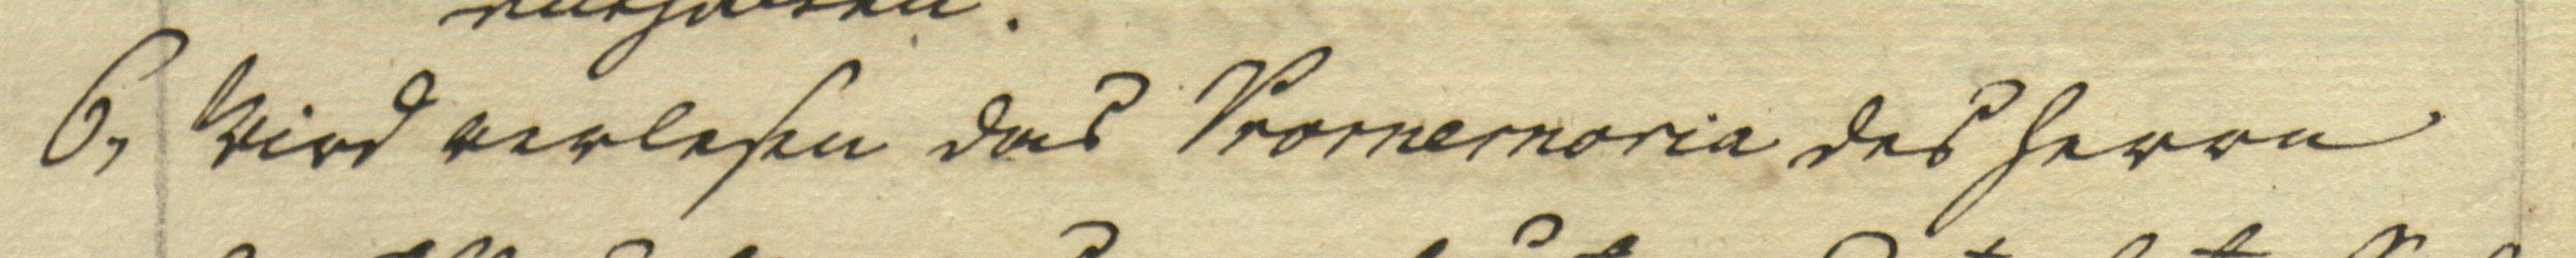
6., Wird verlesen das Promemoria des Herrn
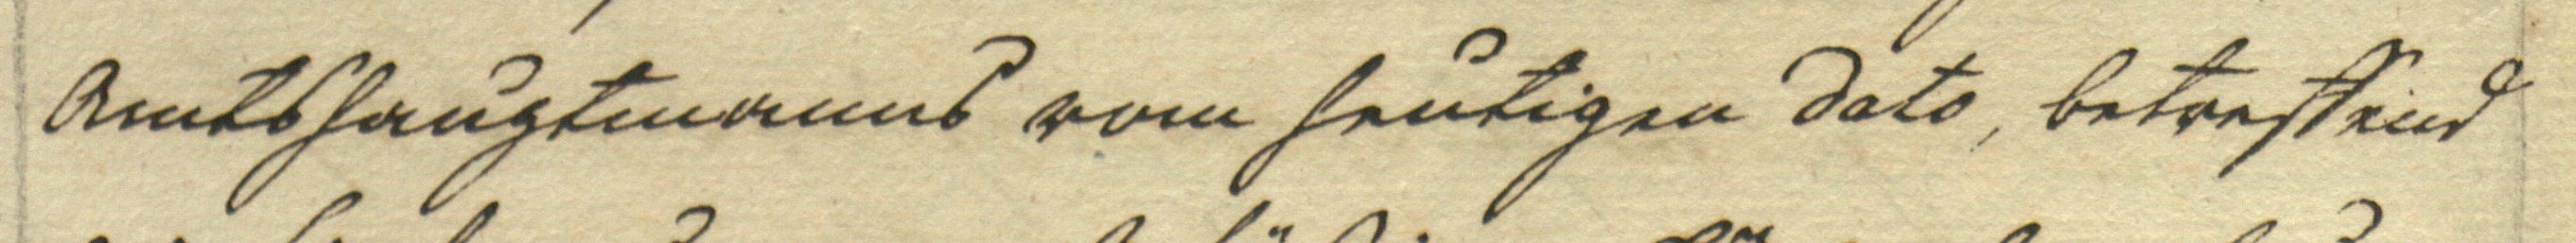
Amtshauptmanns vom heutigen dato, betreffend
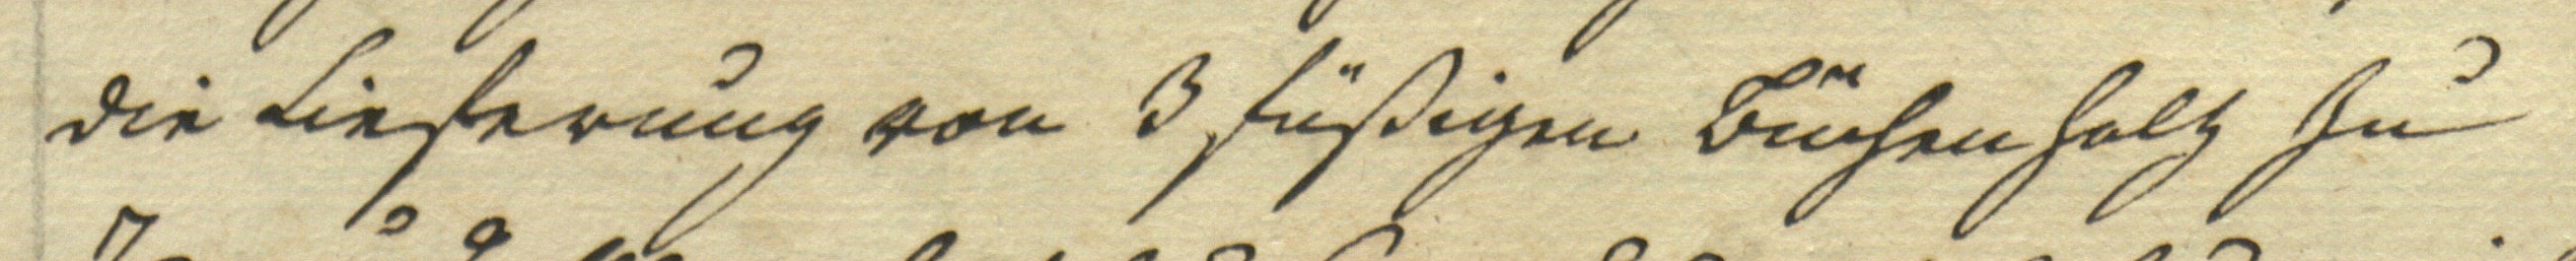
die Lieferung von 3 füßigen Buchenholz zu
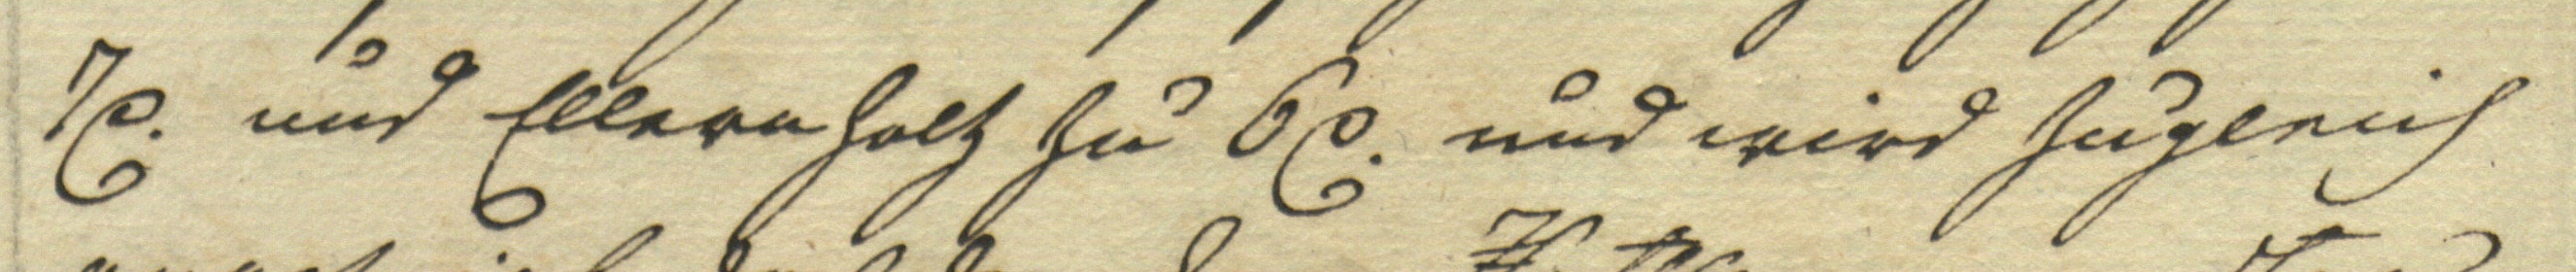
7 l. und Ellernholz zu 6 l. und wird zugleich
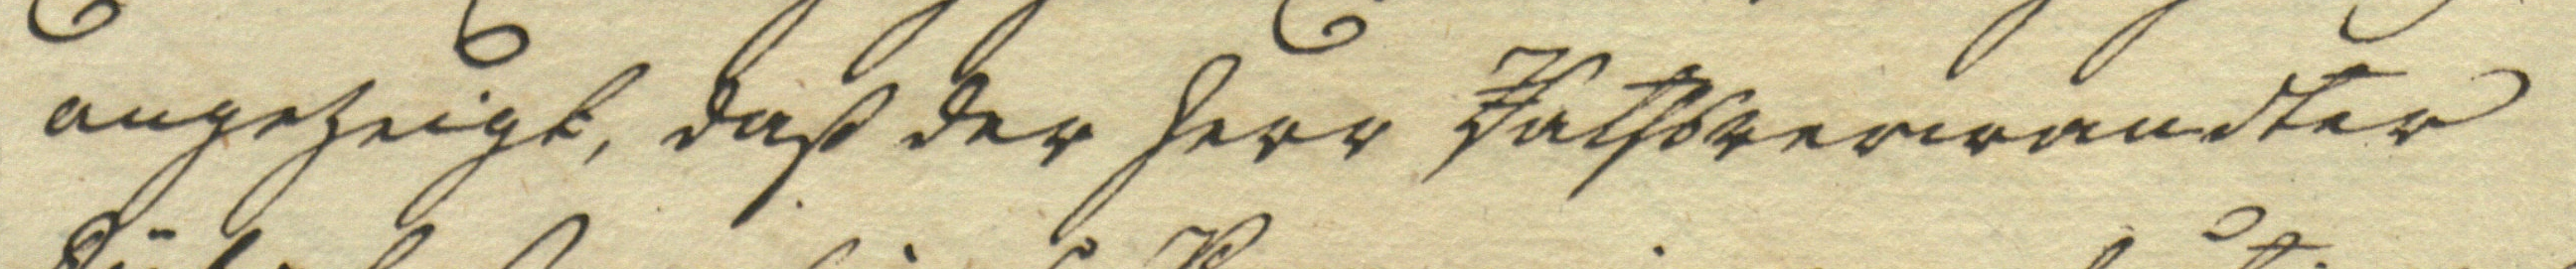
angezeigt, daß der Herr Rathsverwandter
